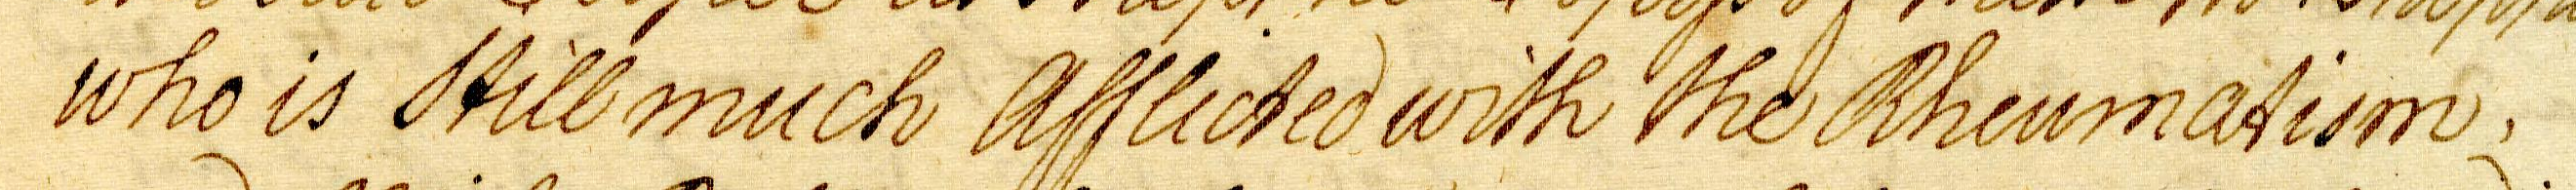who is still much Afflicted with the Rheumatism,
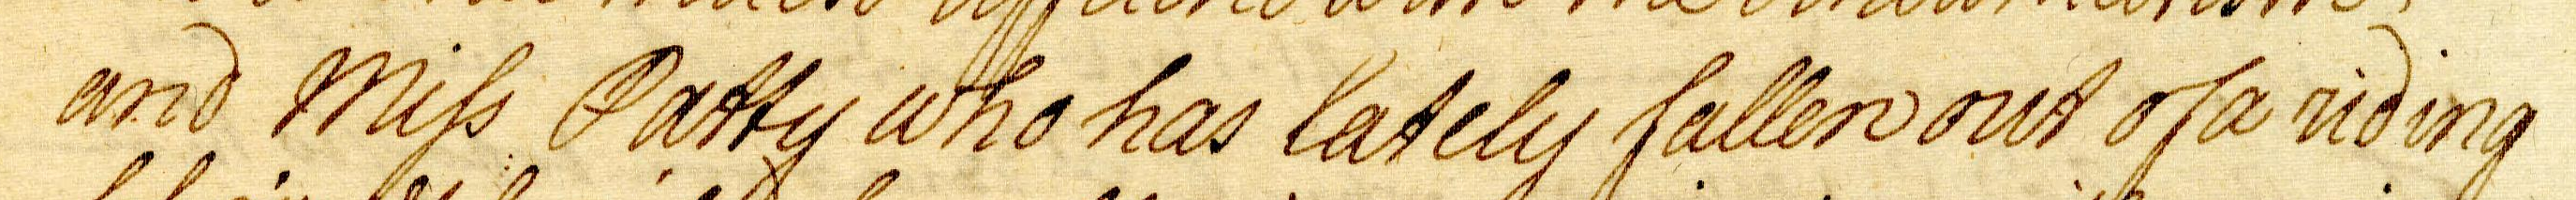and Miss Patty who has lately fallen out of a riding
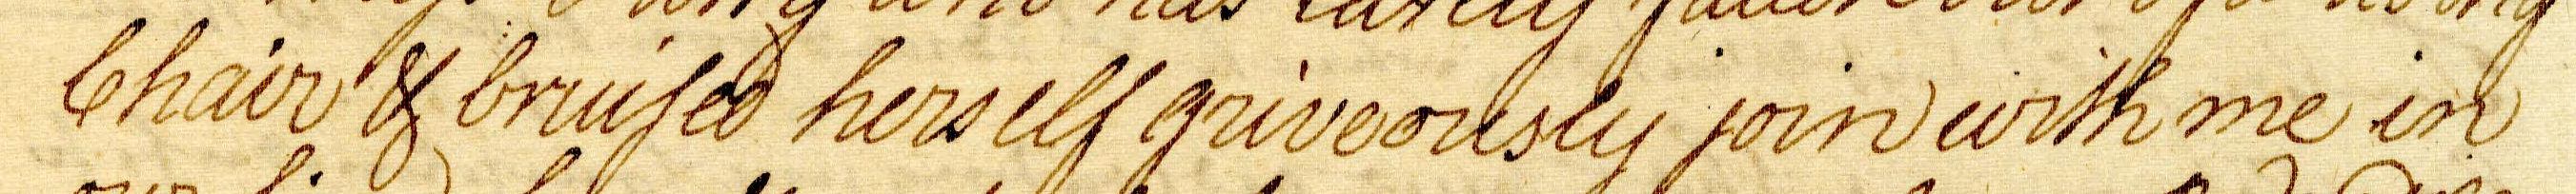Chair & bruised herself griveously join with me in
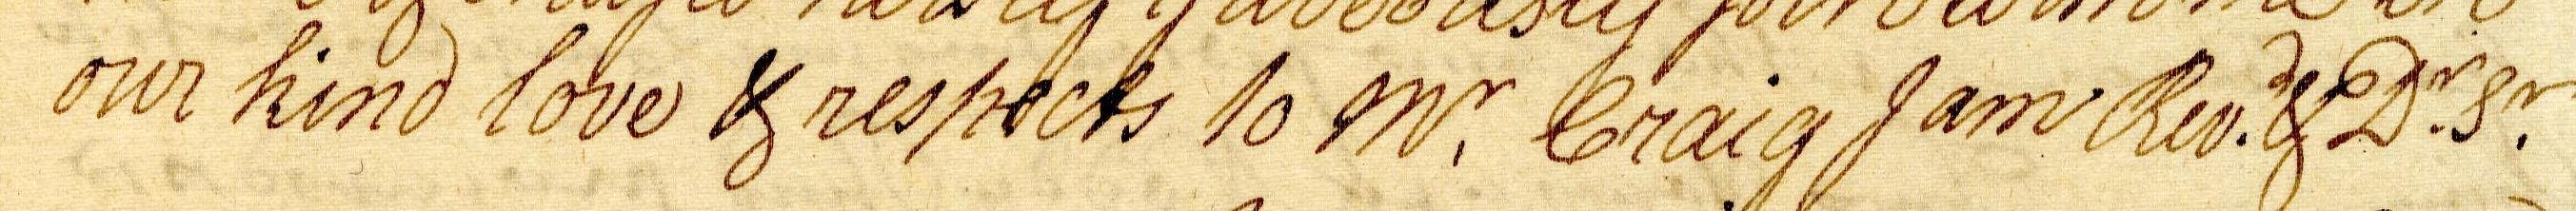our kind love & respects to M^r. Craig I am Rev.^d & D^r. S.^r
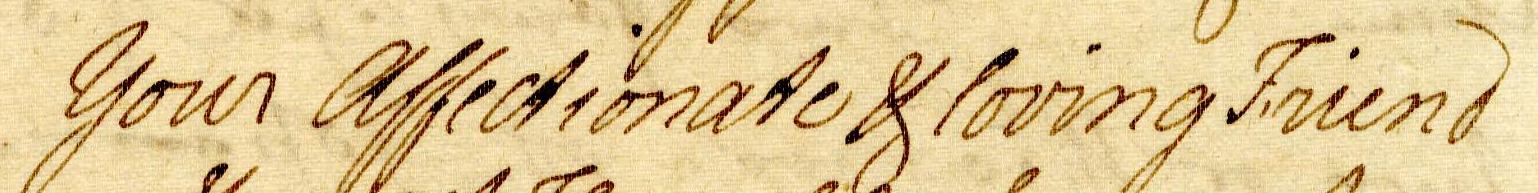Your Affectionate & loving Friend
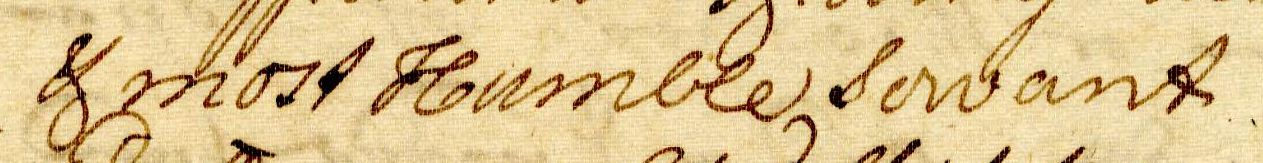& most Humble Servant
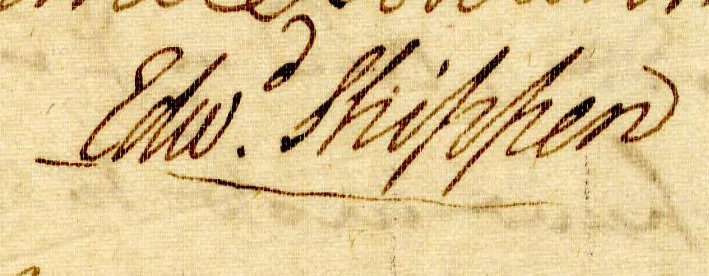Edw^d. Shippen
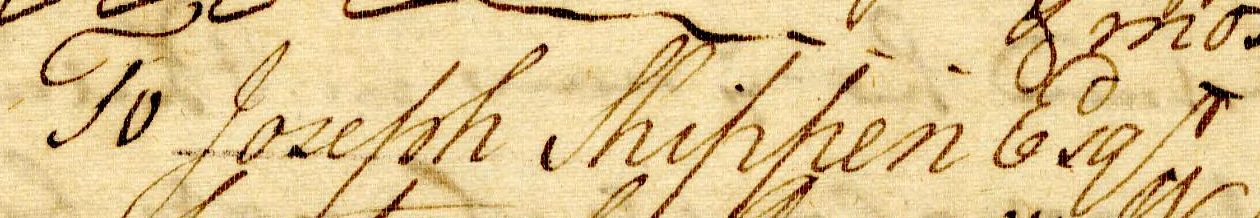To Joseph Shippen E sq^r.
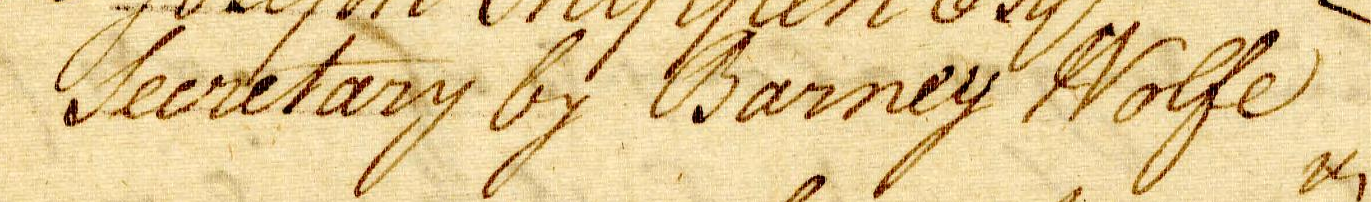Secretary by Barney Wolfe
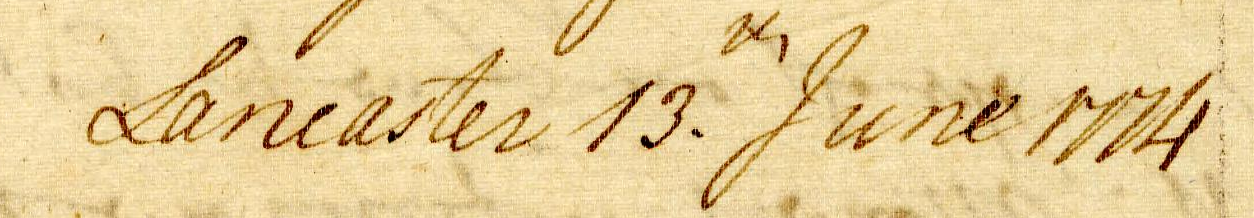Lancaster 13.^th June 1774
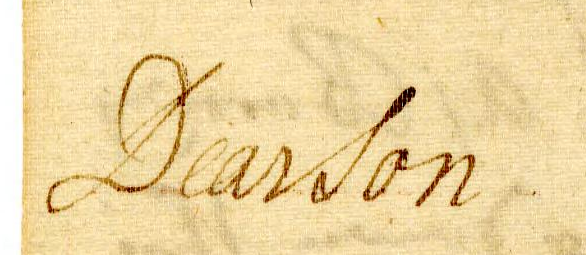Dear Son
